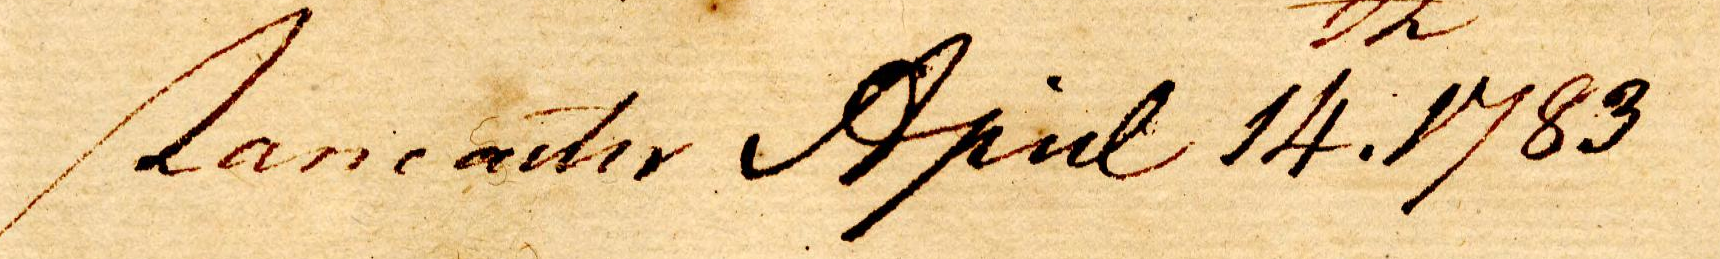Lancaster April 14^th. 1783
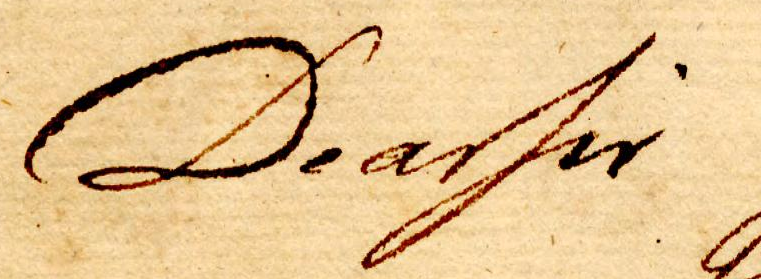Dear sir
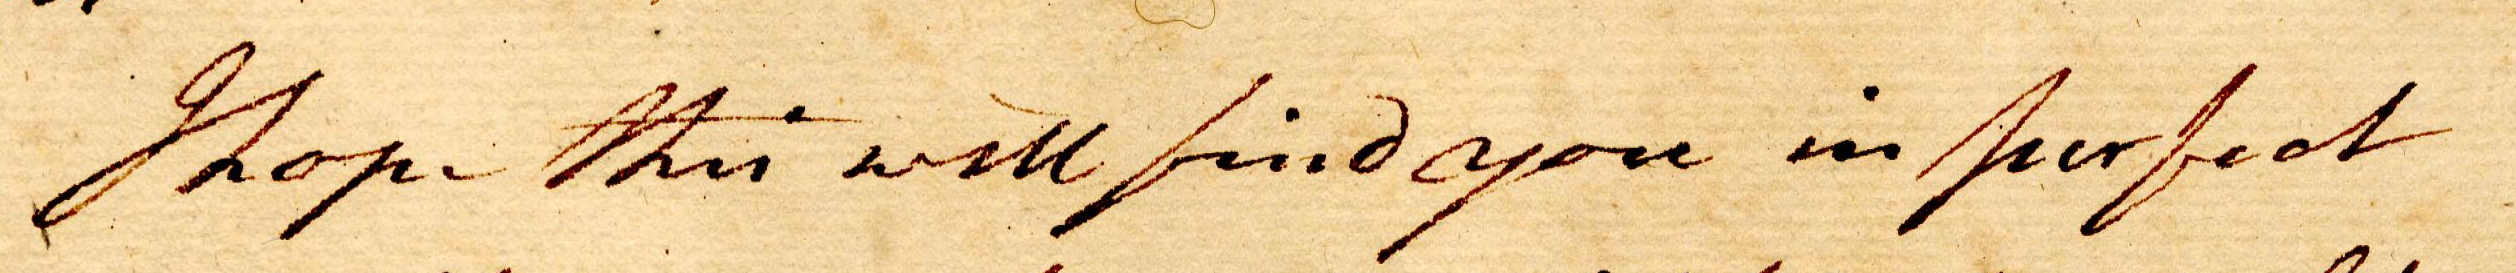I hope this will find you in perfect
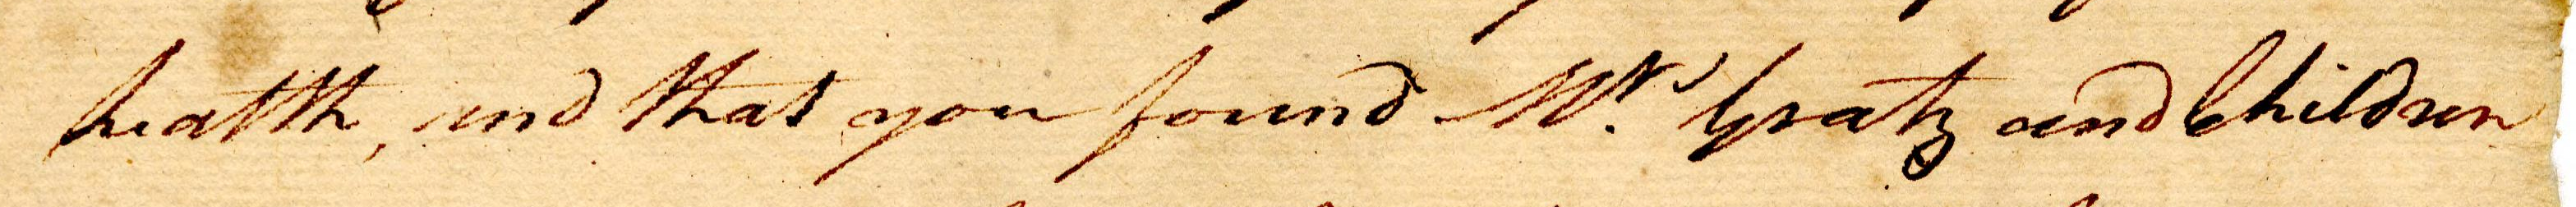health, and that you found M^r. Gratz and Children
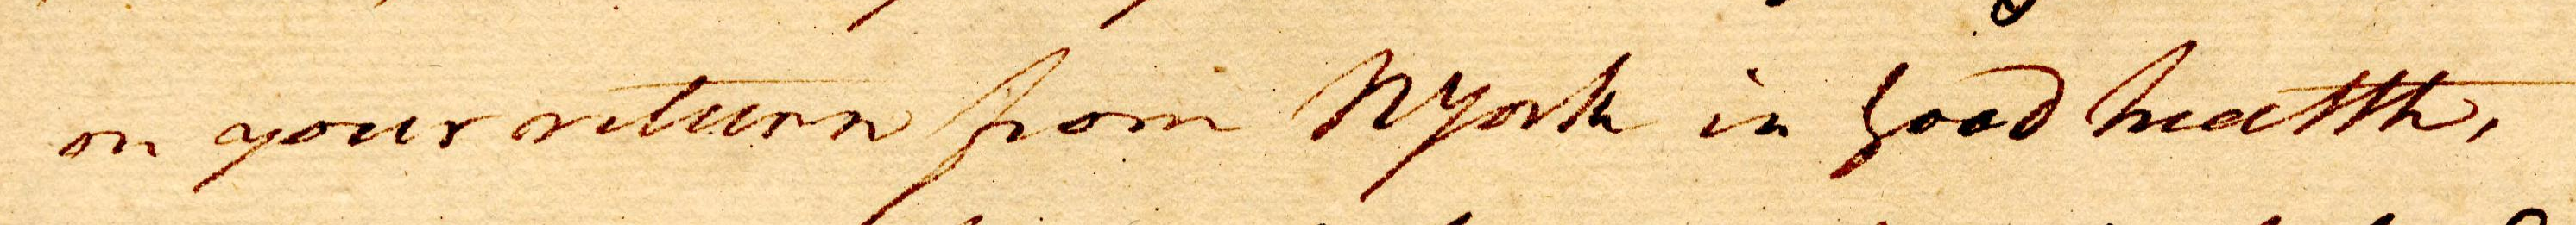on your return from N York in good health,
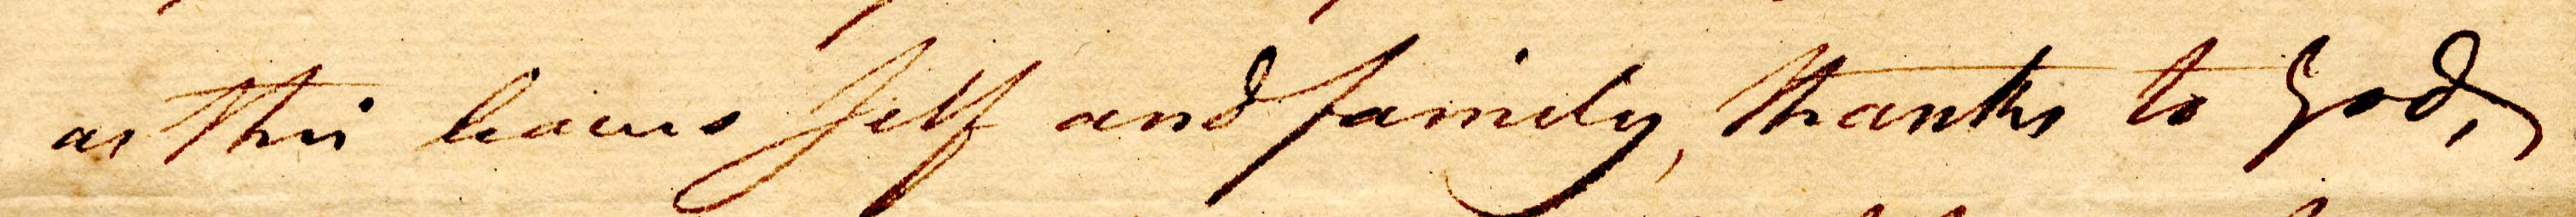as this leaves self and family, thanks to God.
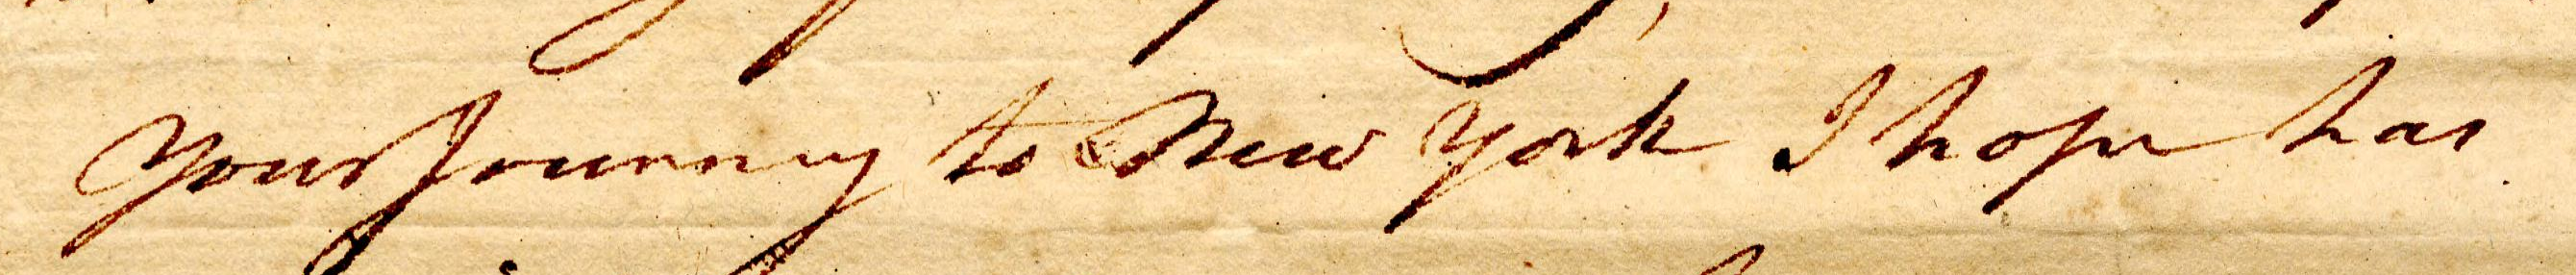Your Journey to New York I hope has
